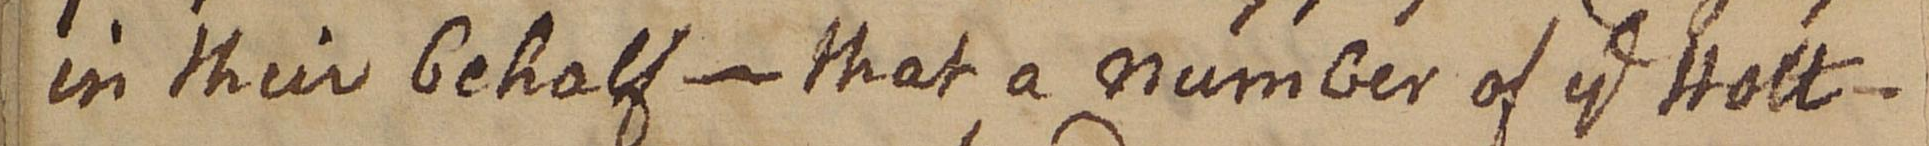in their behalf- that a number of y^e Hott-
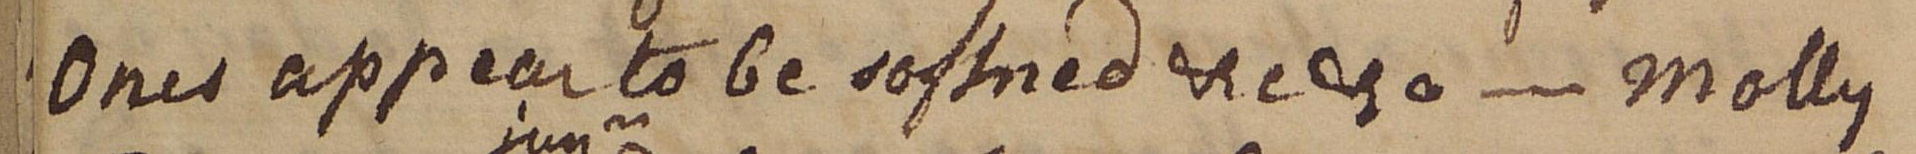Ones appear to be softned &c &c- Molly
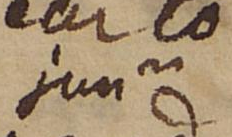jun^r
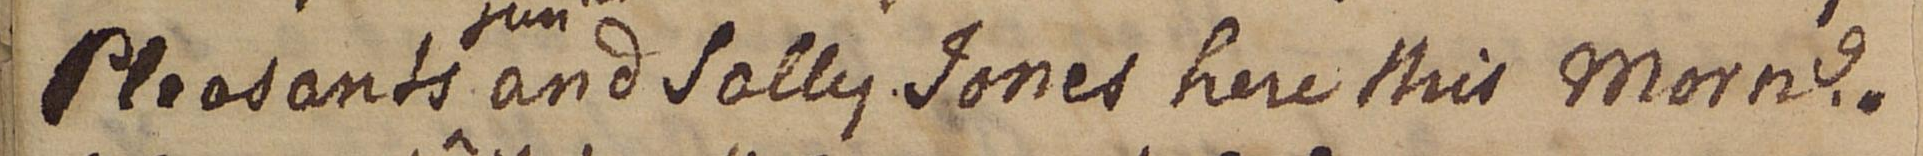Pleasants ^ and Sally Jones here this Morn^g..
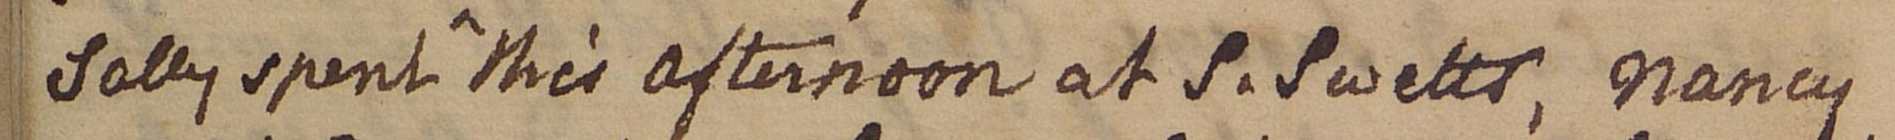Sally spent this afternoon at S. Swetts, Nancy
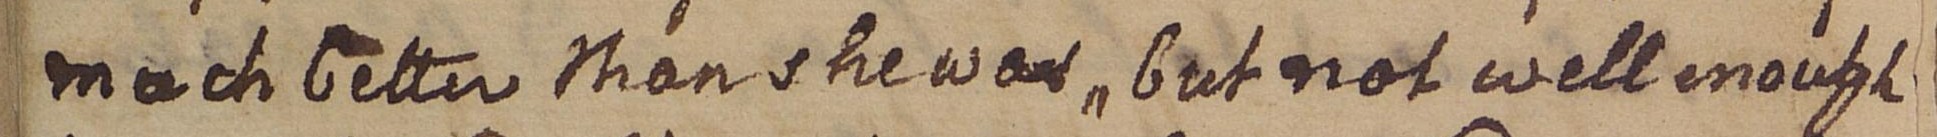much better than she was, but not well enough
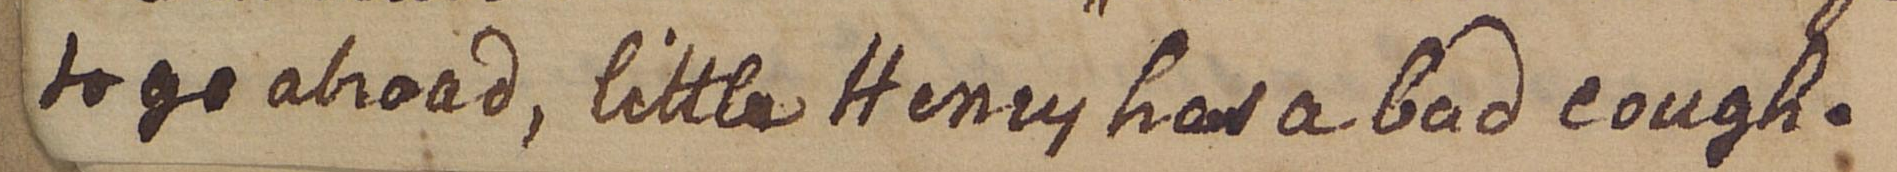to go abroad, little Henry has a bad cough.
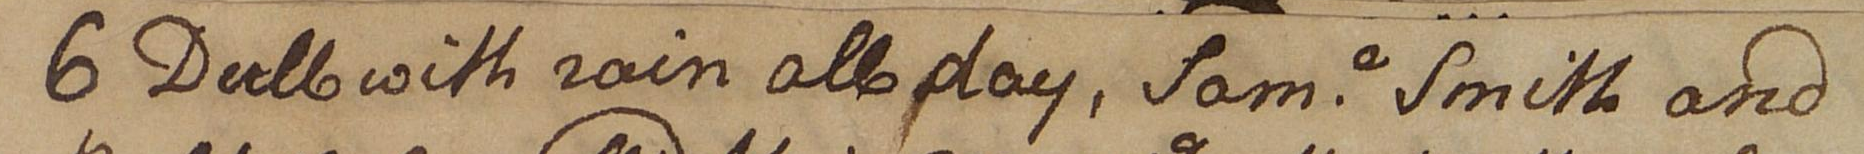6 Dull with rain all day, Sam^l. Smith and
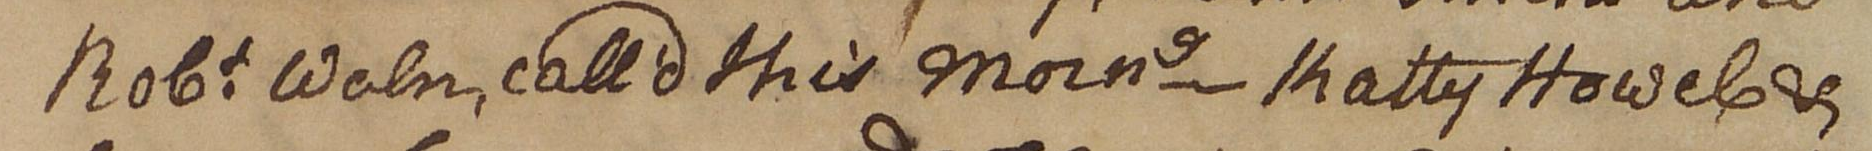Rob^t. Waln, call'd this Morn^g- Katty Howell &
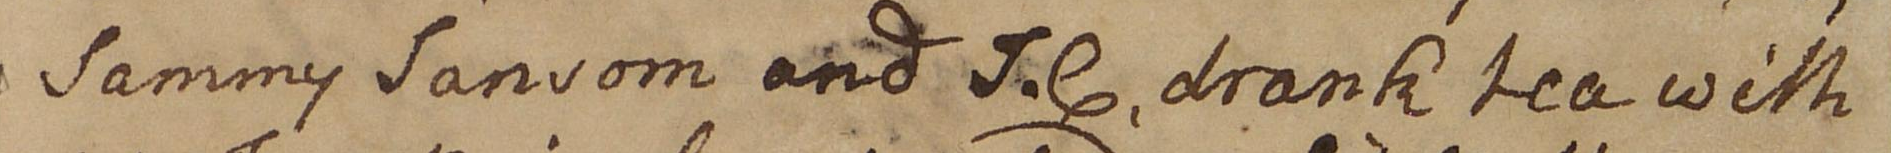Sammy Sansom and J.C. drank tea with
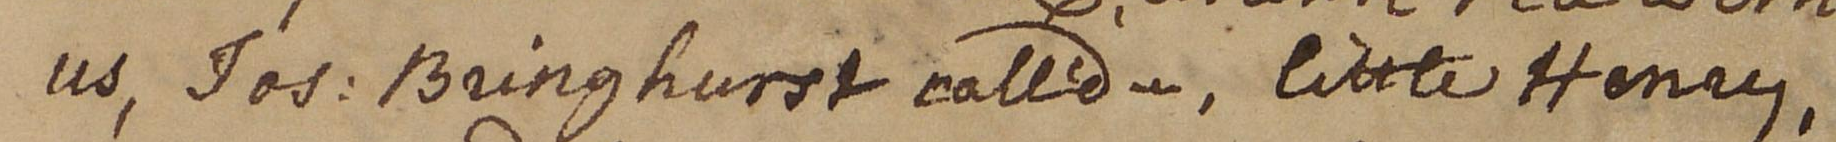us, Jos. Bringhurst call'd-, little Honey,
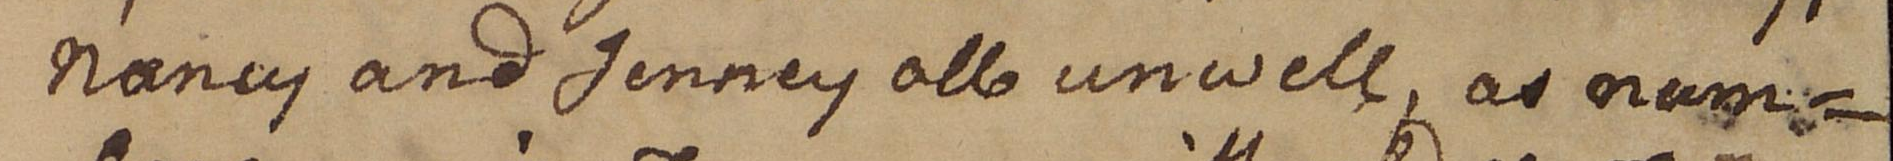Nancy and Jenney all unwell, as num-
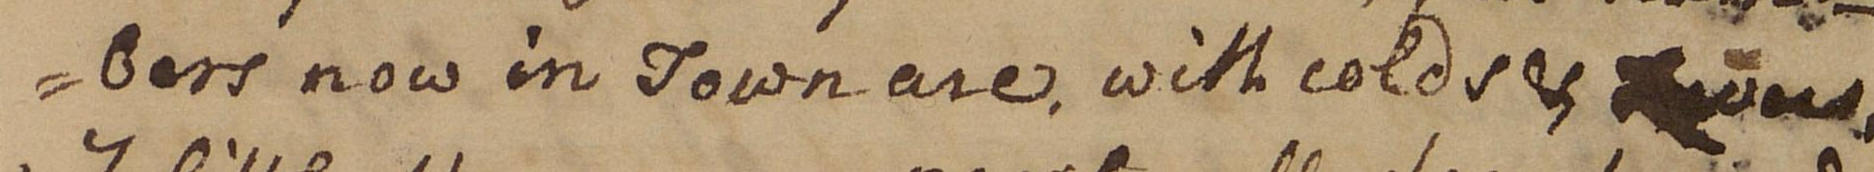-bers now in Town are with colds & [_] was
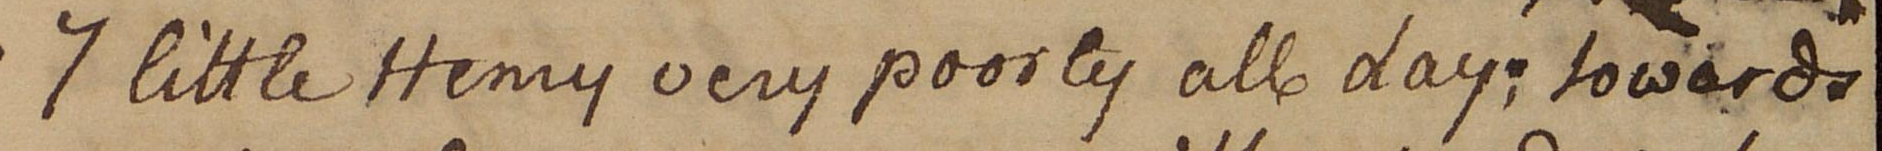7 little Henry very poorly all day, towards
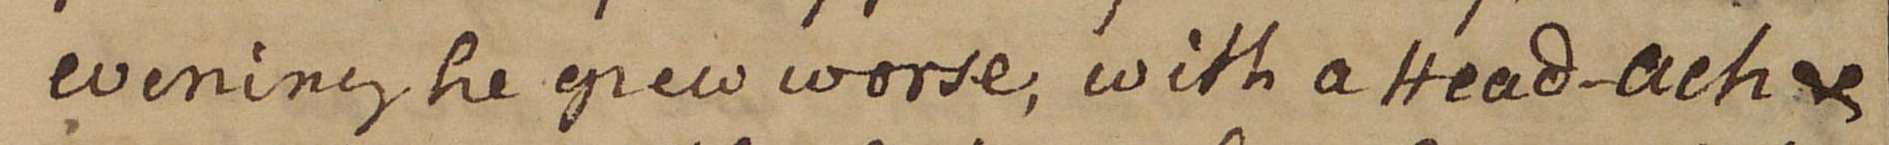evening he grew worse, with a Head-ach &
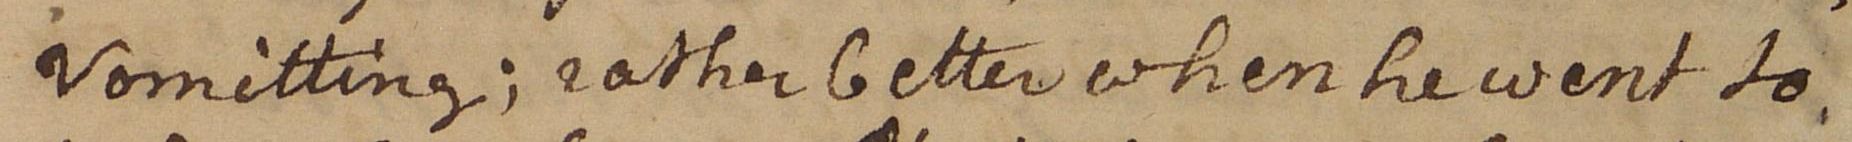Vomitting; rather better when he went to
